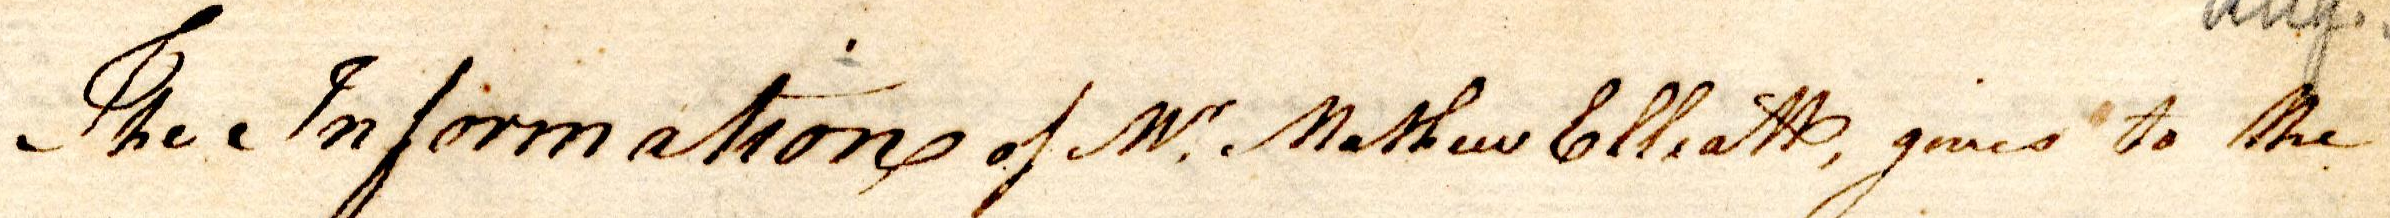Thee Informations of M^r. Mathew Elliott, gives to the
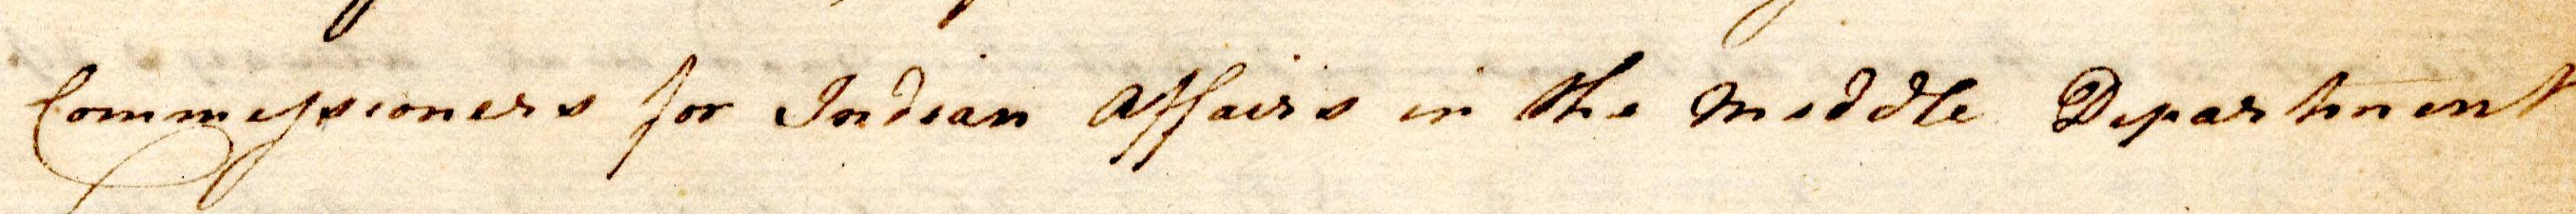Commissioners for Indian Affairs in the Middle Department
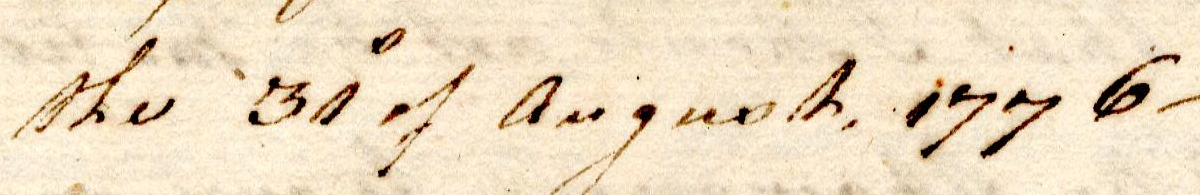the 31^t of August, 1776
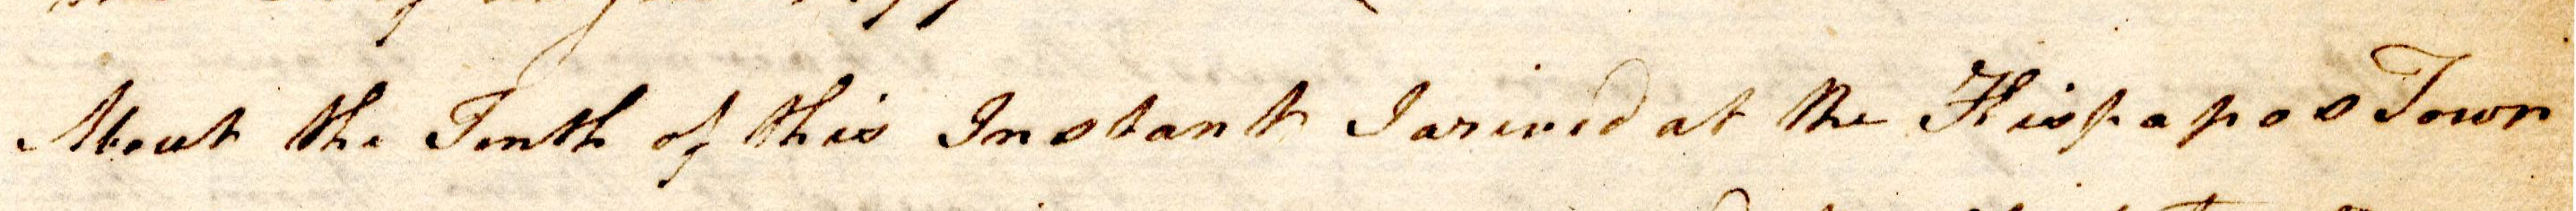About the Tenth of this Instant I arived at the Kickapoo Town
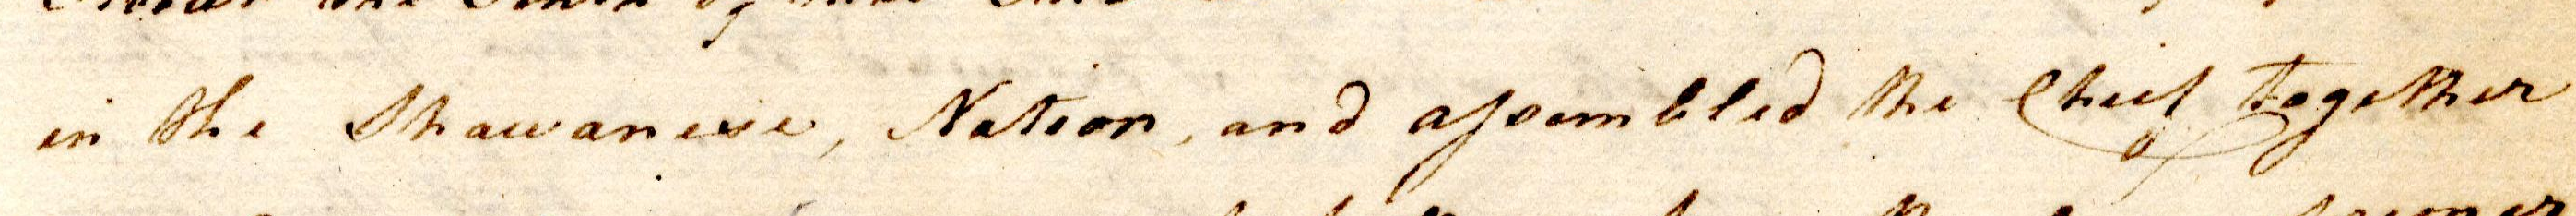in the Shawanese Nation and assembled the Chief together
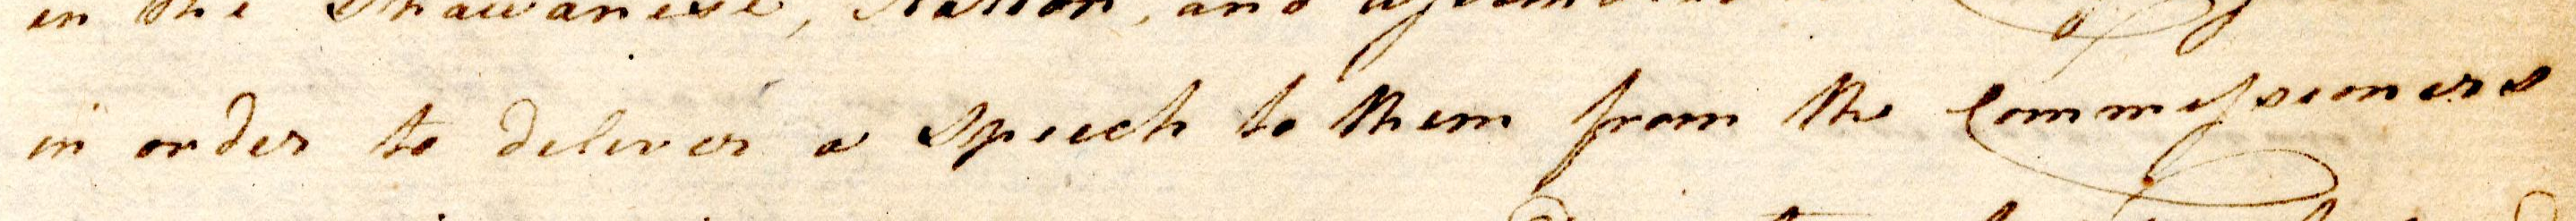in order to deliver a speech to them from the Commissioners
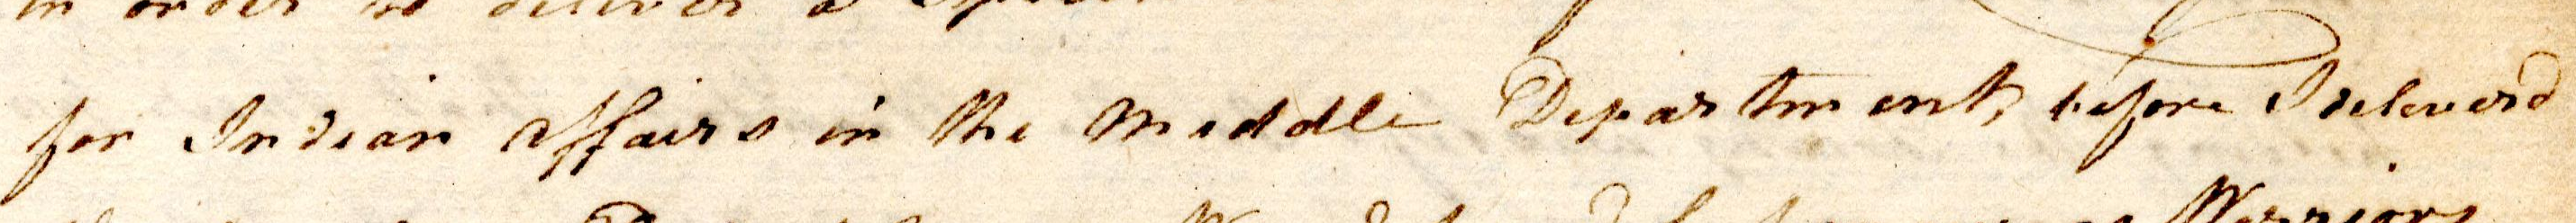for Indian affairs in the Middle Department, before I deliver'd
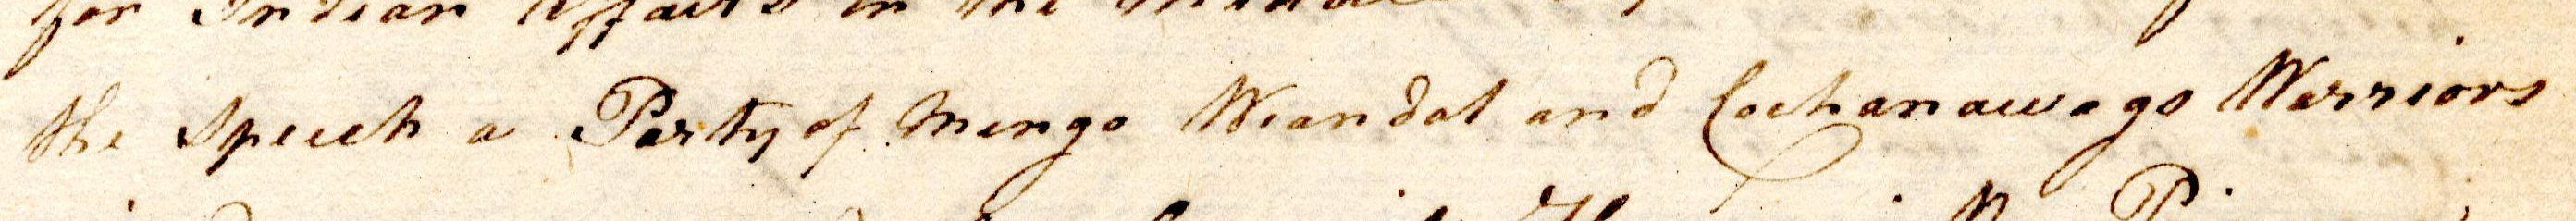the Speech a Party of Mingo Wiandot and Cochanawago Warriors
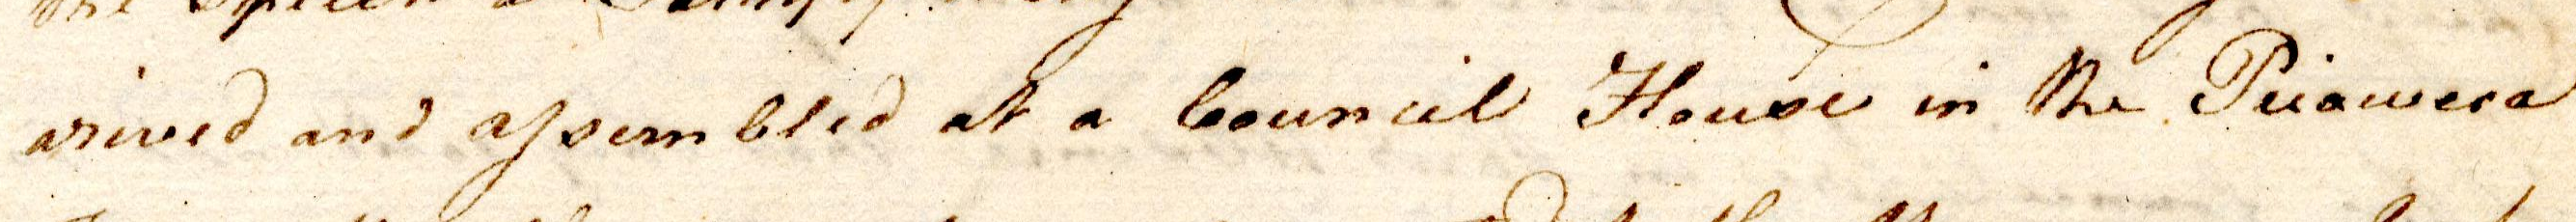arived and assembled at a Council House in the Peiawera
